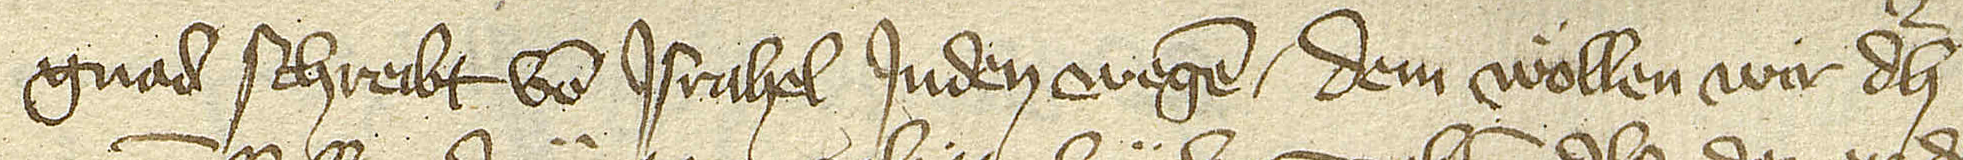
gnad ſchreibt vo* Iſrahel Iuden wege* / dem wöllen wir d*h
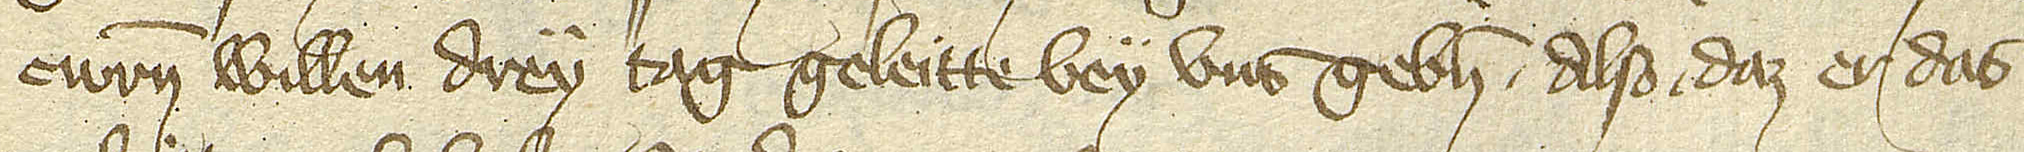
ewrn* willen drey tag geleitte bey vns gebn* / Alſo / daʒ er das
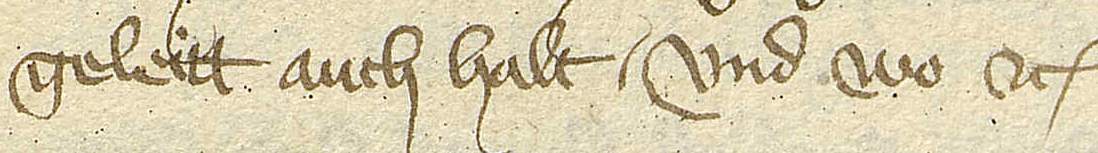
geleitt auch halt / vnd wo ec*
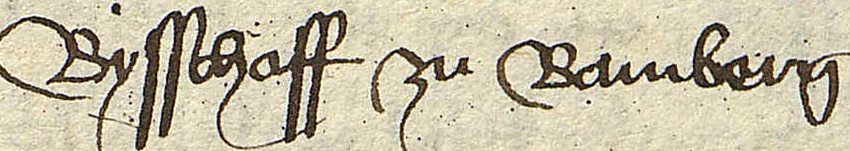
Byſſchoff cʒu Bamberg
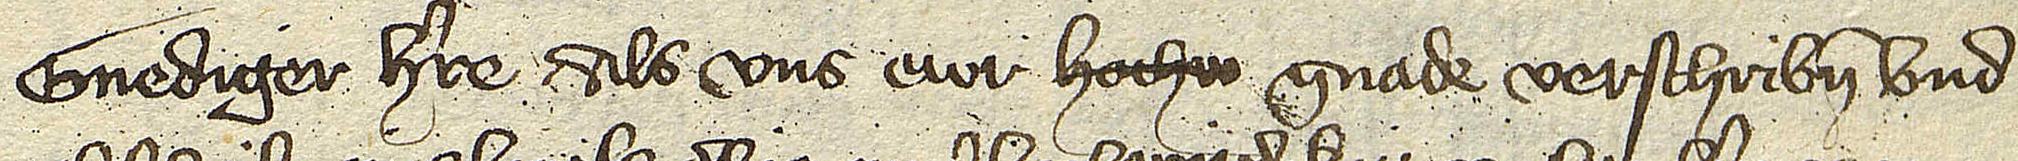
Gnediger h*re / Als vns ewr hochw gnade verſchribn* vnd
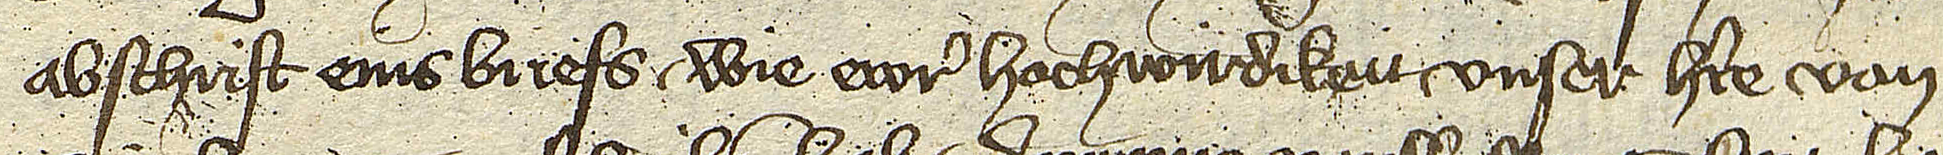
abſchrift eins briefs / wie ewr* hochwirdikeit vnſer h*re von
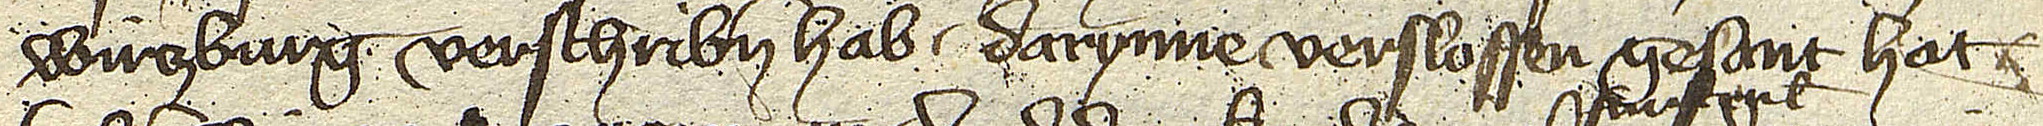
wircʒburg verſchribn* hab / darynne verſloſſen geſant hat /
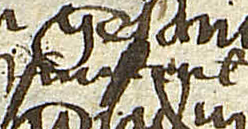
fürſtenl*
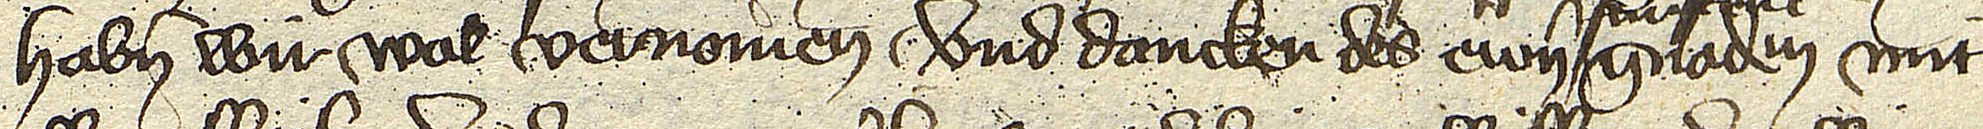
habn* wir wol vernomen / vnd dancken des ewn* gnaden mit
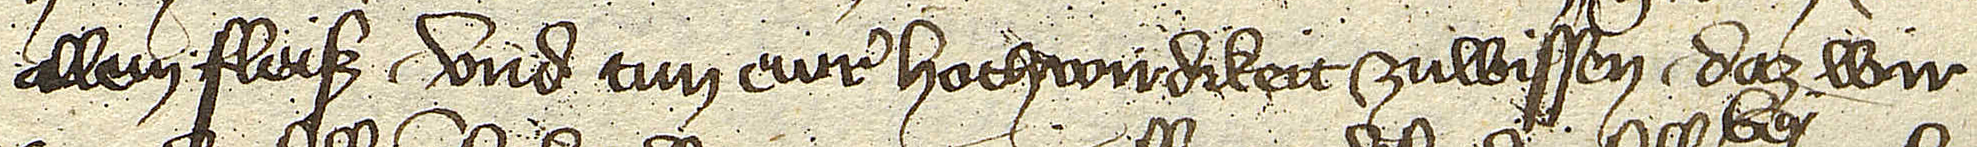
allem fleiſʒ / vnd tun ewr* hochwirdikeit cʒuwiſſen / daʒ wir
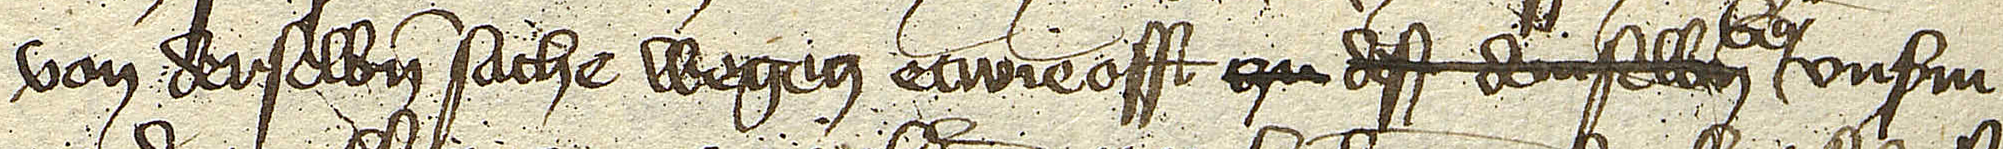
von derſelbn* ſache wegen etwieofft cʒu deſ demſelbn vnſ*m
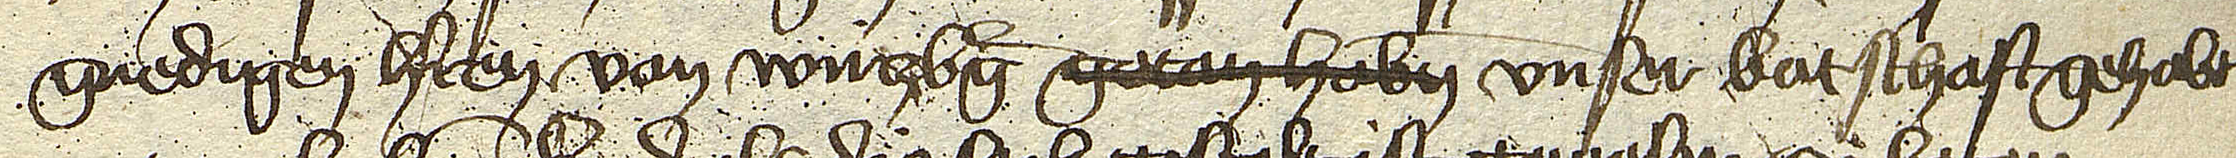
gnedigen h*ren von wircʒb*g getan habn* vnſer botſchaft gehabt
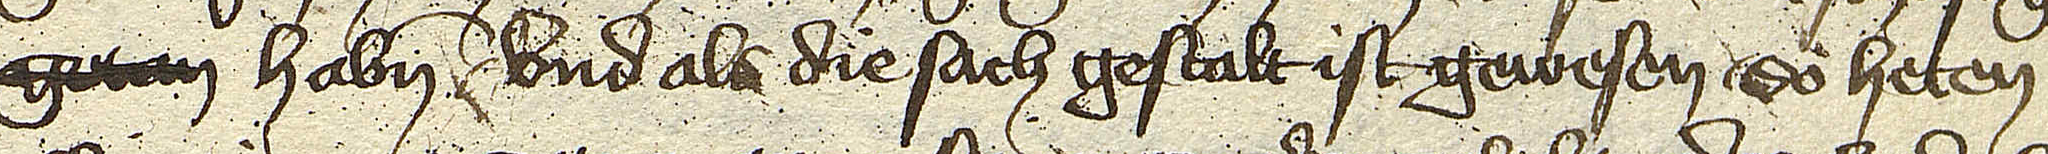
getan habn* / vnd als die ſach geſtalt iſt geweſen / So heten
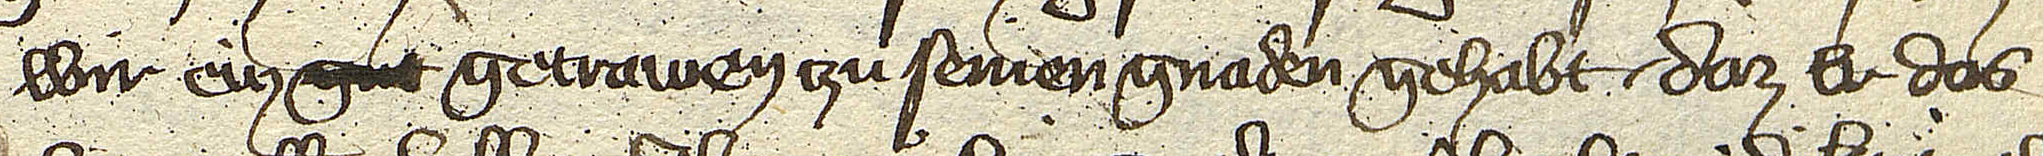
wir ein gut getrawen cʒu ſeinen gnaden gehabt / daʒ Er das
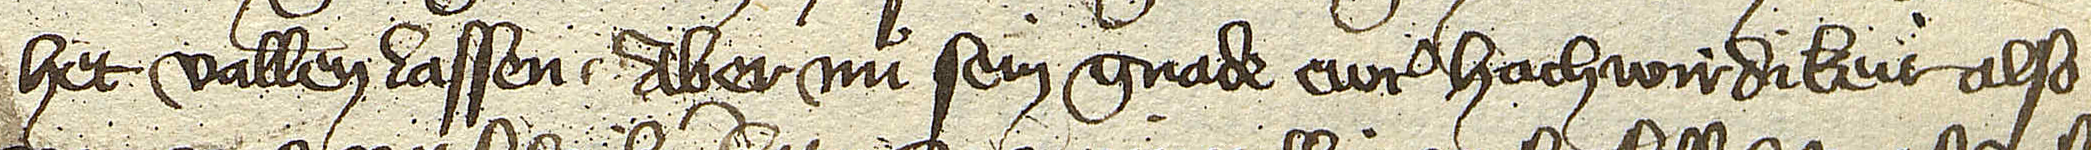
het vallen laſſen / Aber nu ſein gnade ewr* hochwirdikeit alſo
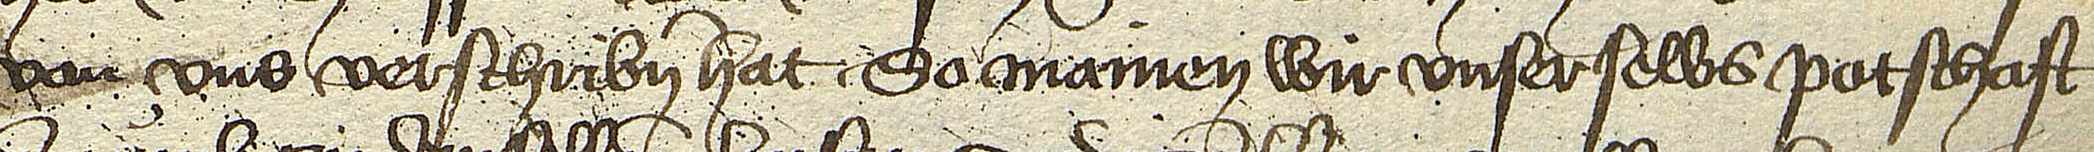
von vns verſchribn* hat / So mainen wir vnſerſelbs potſchaft
